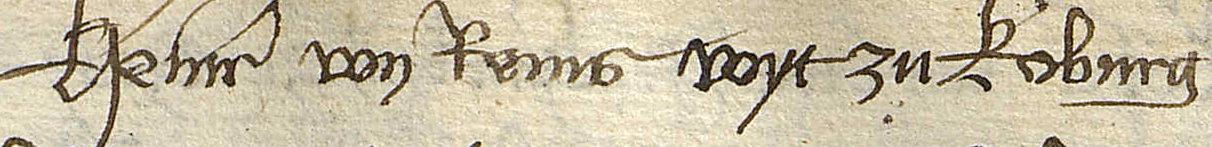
Heinr* von Rems voyt ʒu Koburg
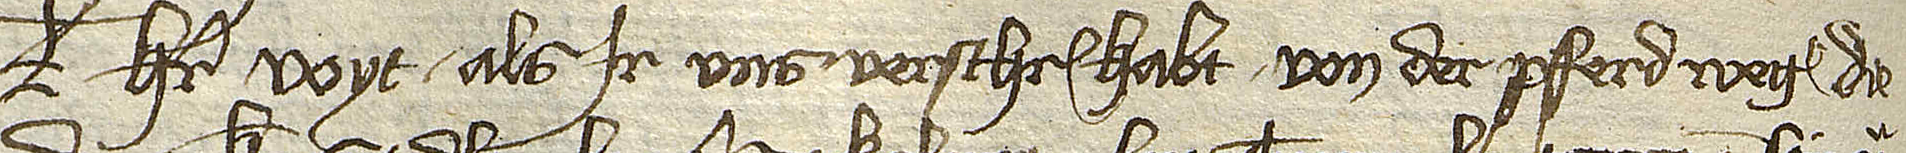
L* Hr* voyt / als Ir vns verſchr* habt / von der pferd weg* die
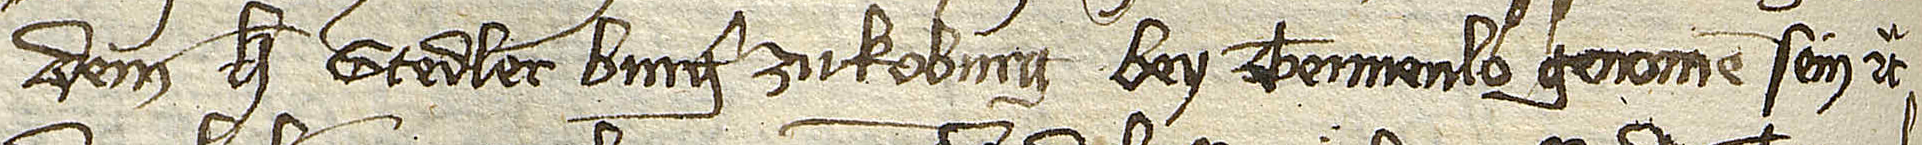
Dem h* Stedler burg* ʒu koburg bey Termenlo genome* ſein ec*
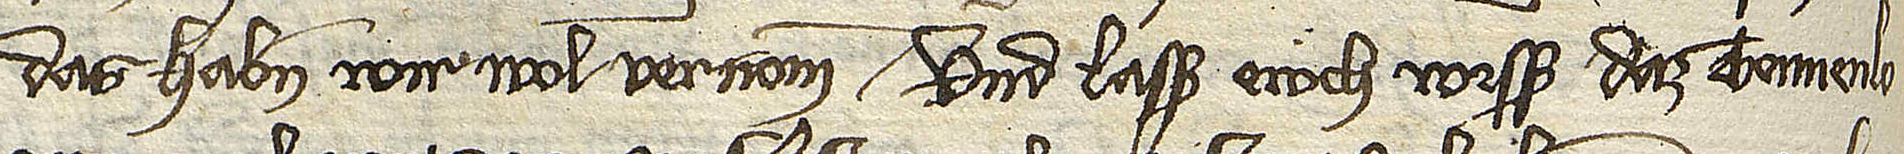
Das habn* wir wol vernom* / Vnd laſſ* eẅch wiſſ* / daʒ Termenlo
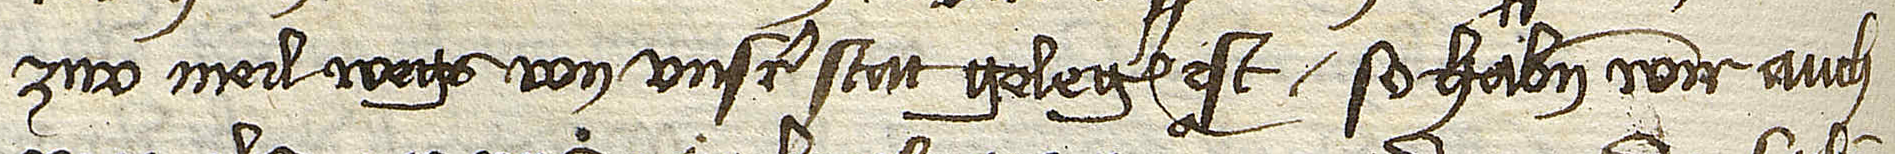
ʒwo meil wegs von vnſr* ſtat geleg* iſt / ſo habn* wir auch
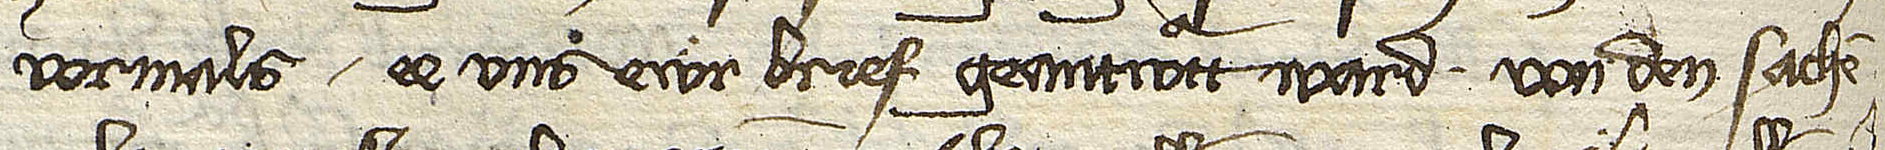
vormals / ee vns eẅr brief geantw*tt ward . von den ſache*
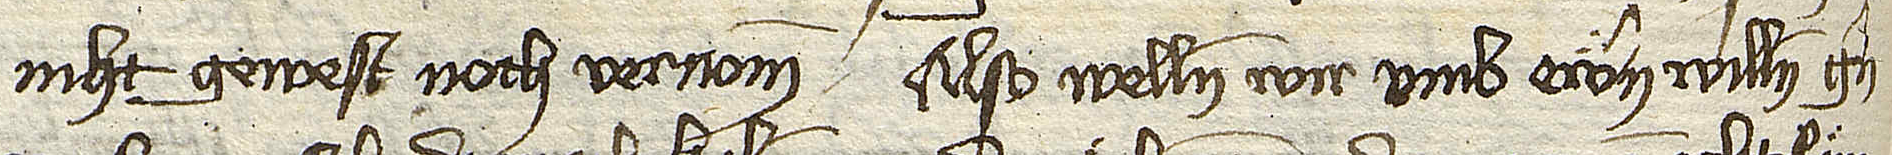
niht geweſt noch vernom* / Alſo welln* wir vmb eẅ*n willn* g*n
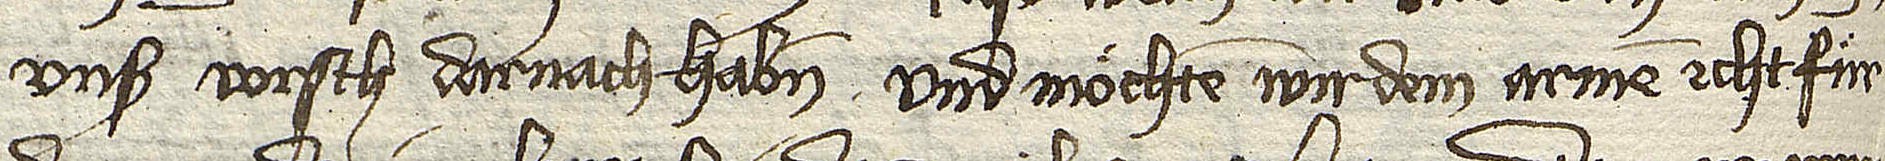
vnſ* vorſch darnach habn* / vnd möchte* wir dem arme* icht für
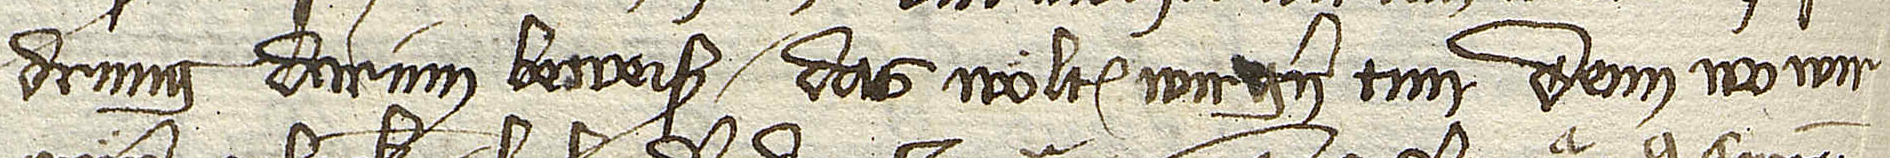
drung darinn beweiſ* / das wölt* wir g*n tun / Denn wo wir
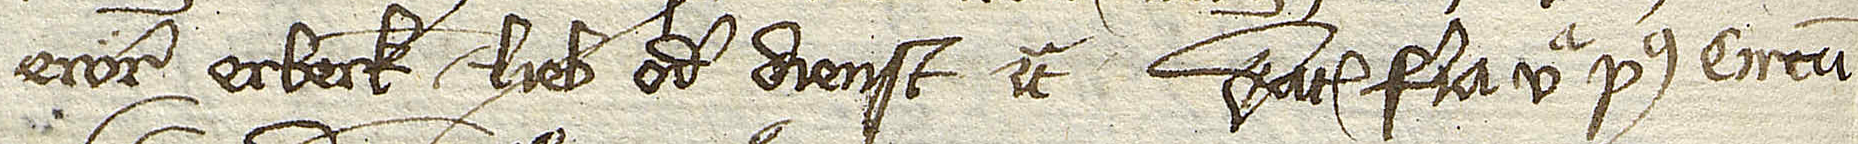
eẅr* erberk* / lieb od* dienſt ec* Dat* fi*a v* p* Circu*
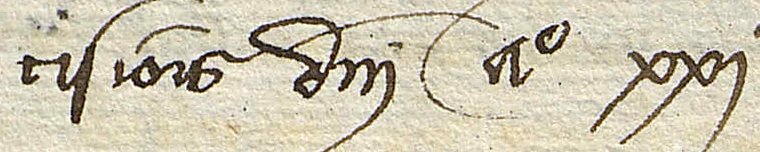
ciſio*is dni* a* xxi*
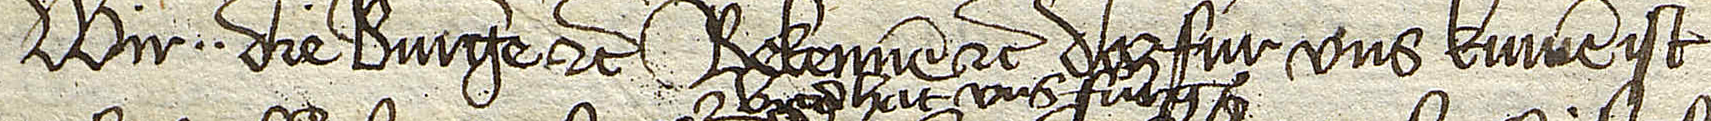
Wir ~ die Burge* ec* Bekenne* ec* Daʒ für vns kume* iſt
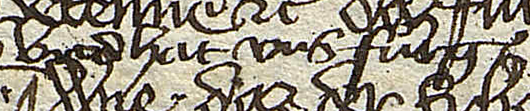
vnd hat vns fürg*
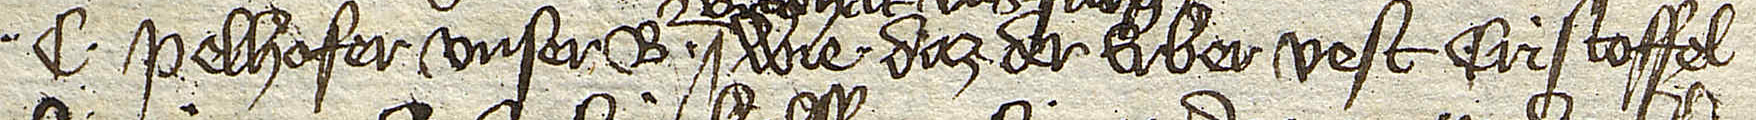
. C . Pelhofer vnſer B* . wie daʒ der Erber veſt Criſtoffel
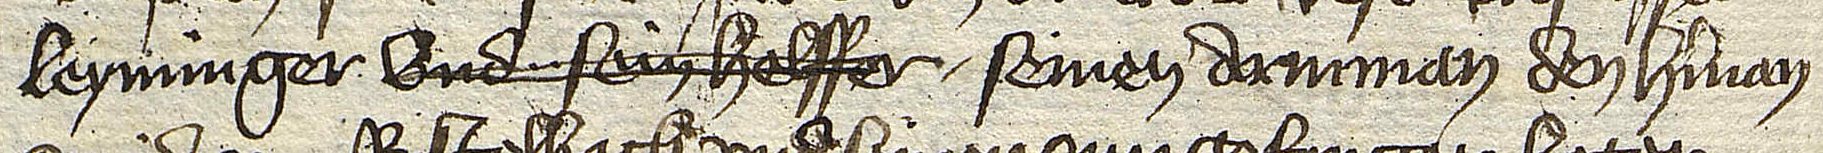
leyminger vnd ~ ſein helffer / ſeinen Armman den h*man
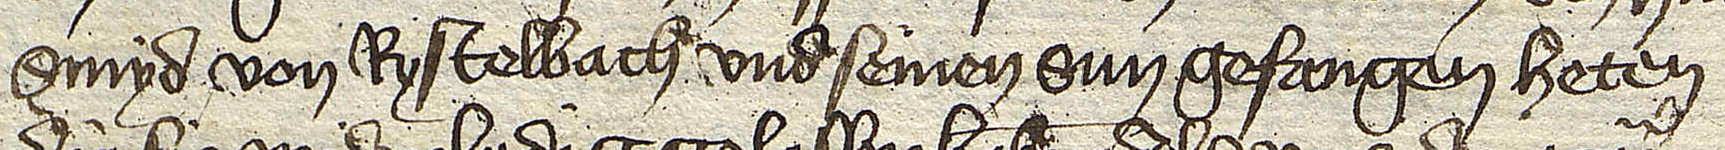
Smyd von Ryſtelbach vnd ſeinen Sun gefangen heten
